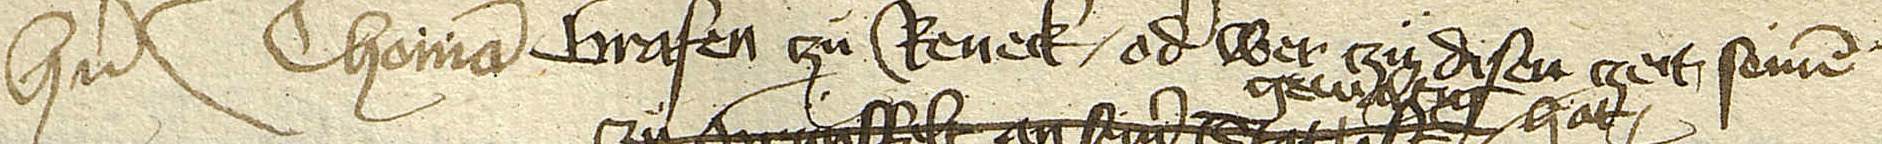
hn* Thoma Grafen cʒu Reneck / od* wer cʒü diſen cʒeit ſeine*
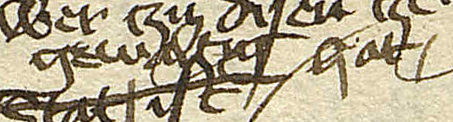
gewalt%% hat /
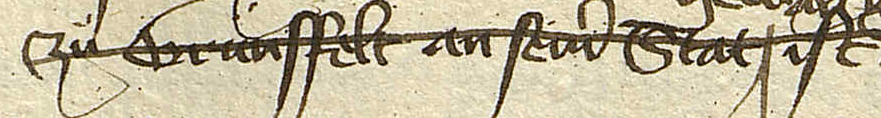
cʒü Grünſfelt an ſein* Stat iſt
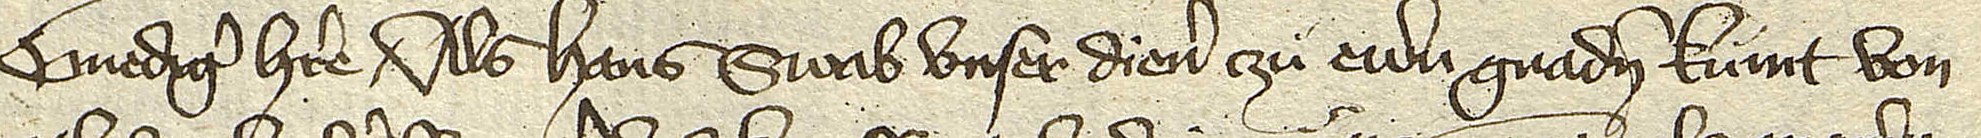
Gnedig* hre* / Als hans Swab vnſer dien* cʒü ew*n gnadn* kümt von
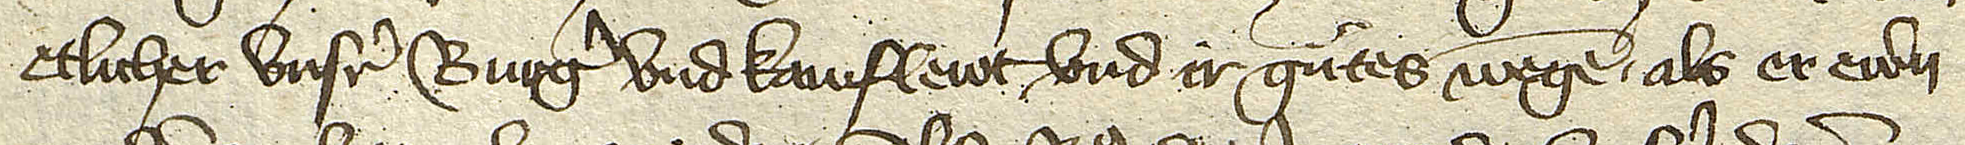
etlicher vnſr* Burg* vnd kawflewt / vnd ir gütes wege* / als er ew*n
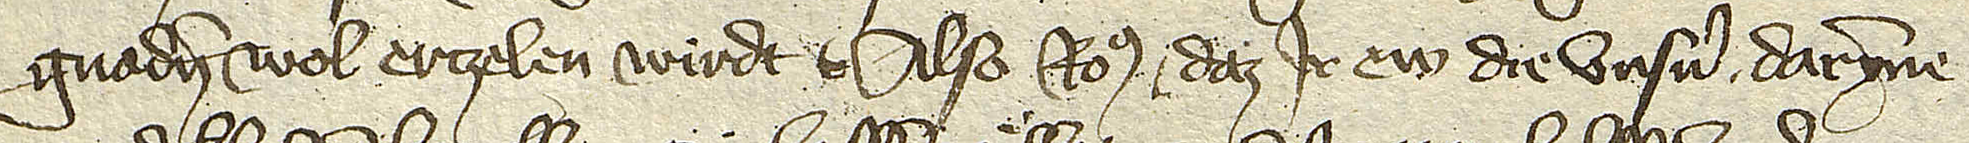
gnadn* wol ercʒelen wirdt / Alſo Ro* / daʒ Ir ew die vnſn* daryne*
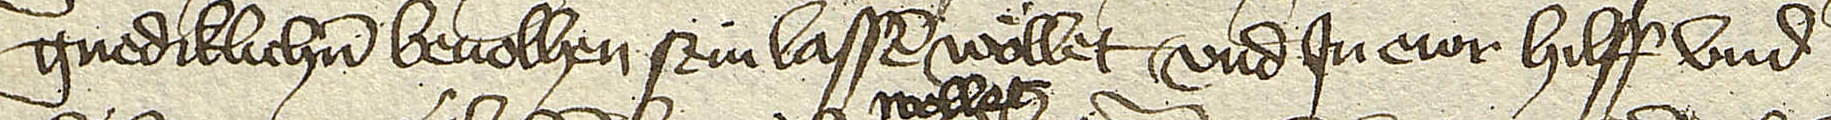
gnediklichn* beuolhen ſein laſſe* wöllet / vnd In ewr hilff vnd
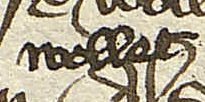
wollet
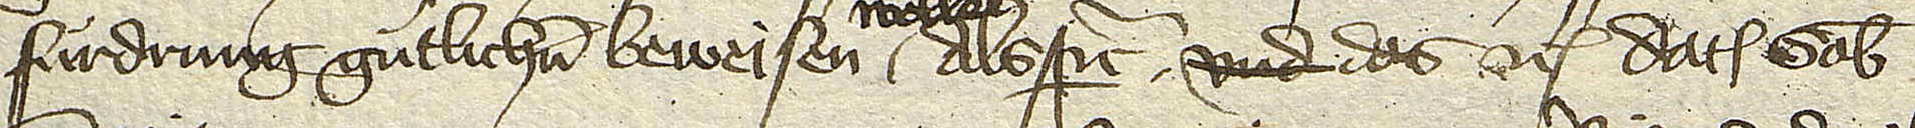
fürdrung gütlichn* beweiſen / Als ec* . vnd das ec* dat* Sab*
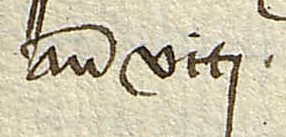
an* viti .
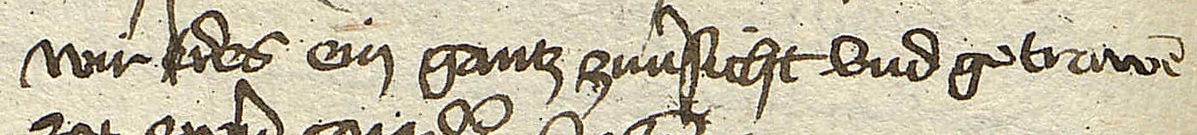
wir edes ein gancʒ cʒuu*ſicht vnd getrawe*
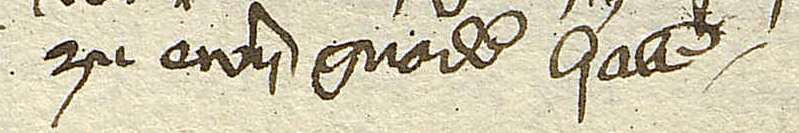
ʒu ewn* gnad* habe* /
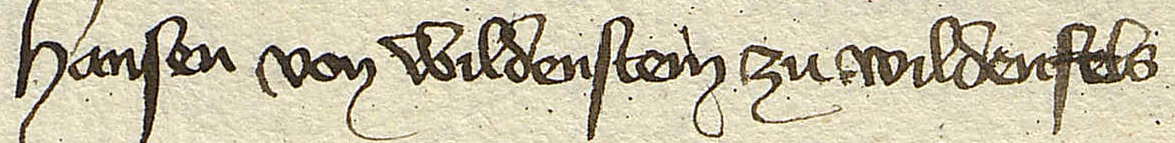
hanſen von Wildenſtein cʒu wildenfels
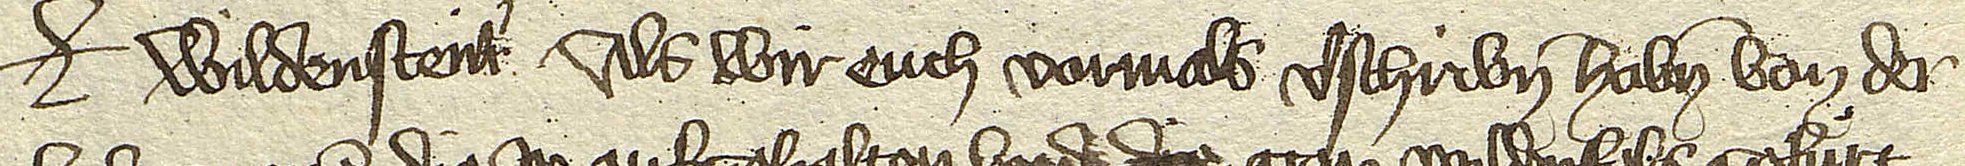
L* Wildenſteinr* / Als wir euch vormals v*ſchribn* habn* von der
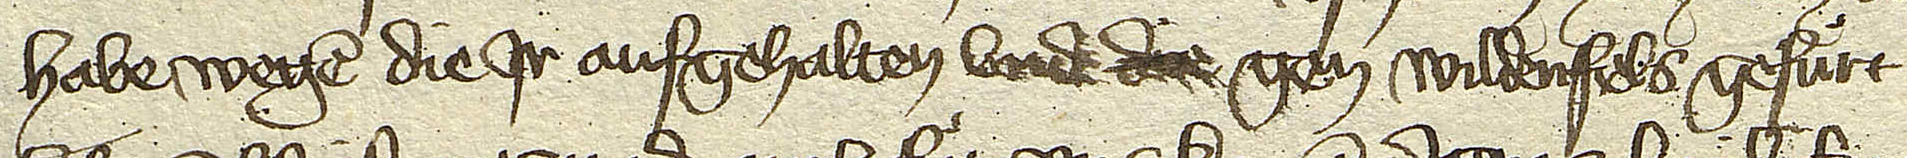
habe wege* die Ir aufgehalten vnd die gen wildenfels gefürt
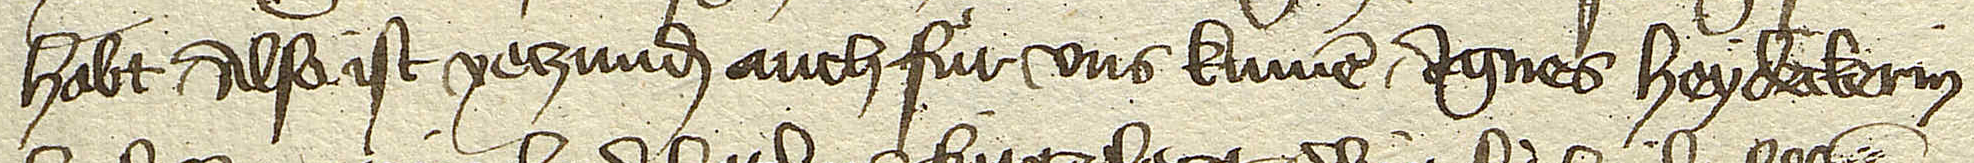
habt / Alſo iſt yecʒund auch für vns kume* / Agnes heydeckerin
